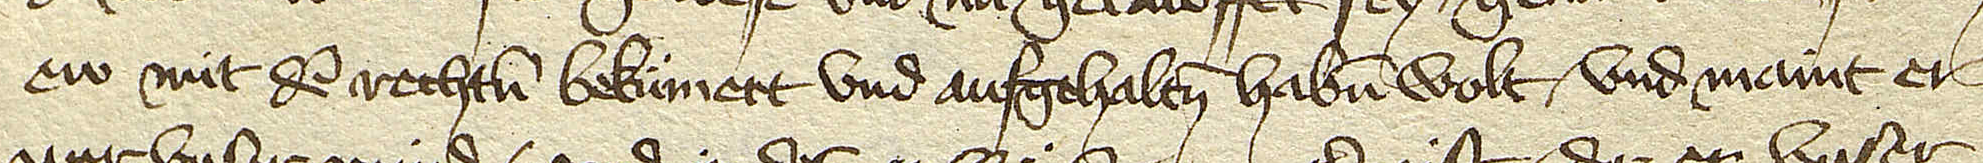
ew mit d* rechtn* bekümert vnd aufgehaltn* habn* wolt / vnd maint er
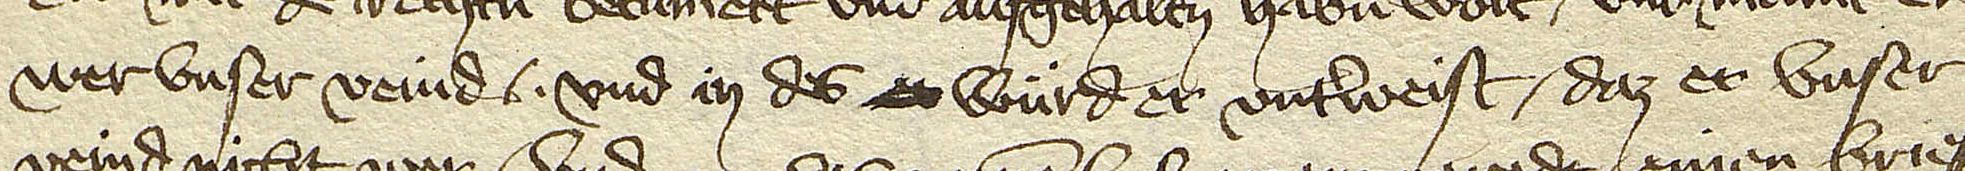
wer vnſer veind / . vnd in des er würd er vnt*weiſt / daʒ er vnſer
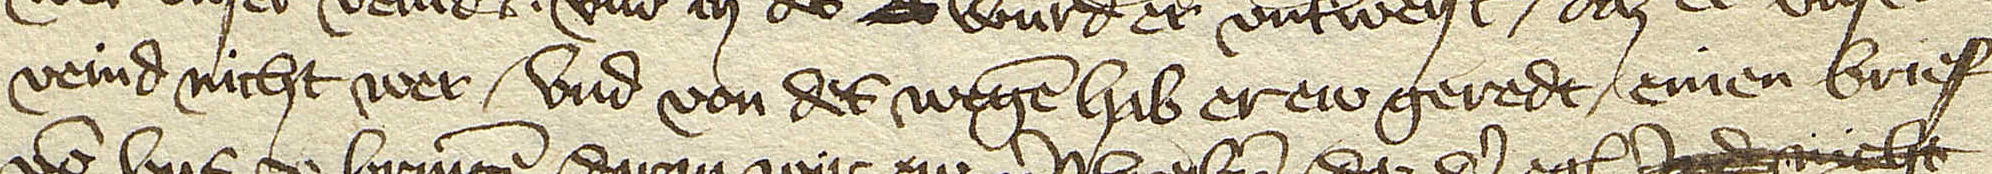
veind nicht wer / vnd von des wege* hab er ew geredt / einen brief
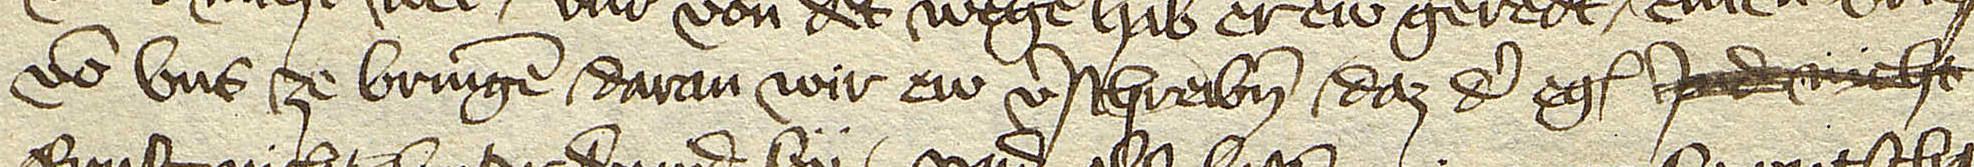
vo* vns cʒe bringe* / daran wir ew v*ſchreibn* / daʒ d* eg* Iud nicht
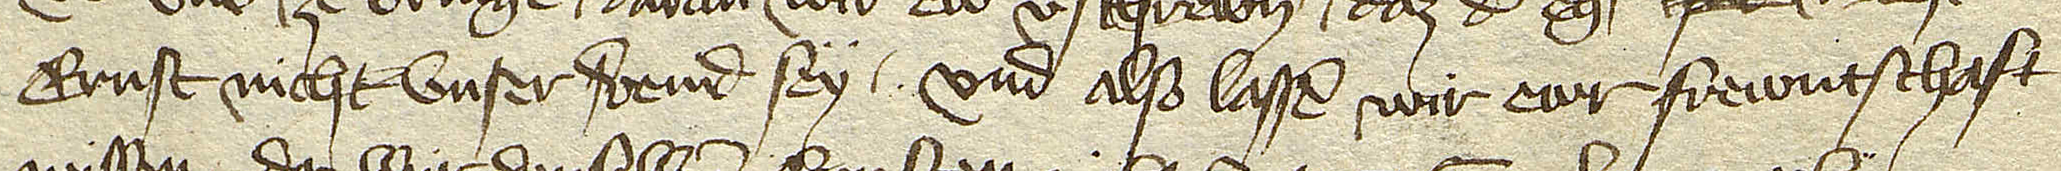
Ernſt nicht vnſer veind ſey / . vnd alſo laſſe* wir ewr frewntſchaft
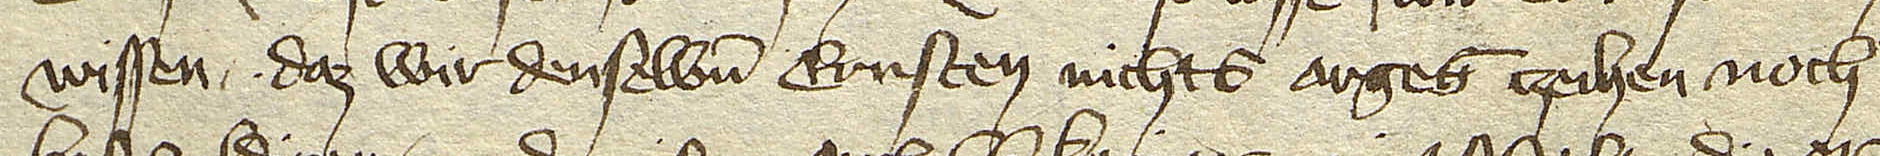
wiſſen / . daʒ wir denſelbn* Ernſten nichts arges cʒeihen noch
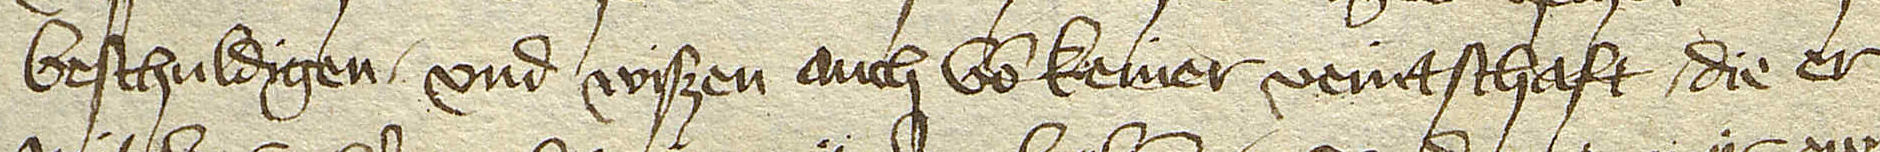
beſchuldigen / vnd wiſʒen auch vo* keiner veintſchaft / die er
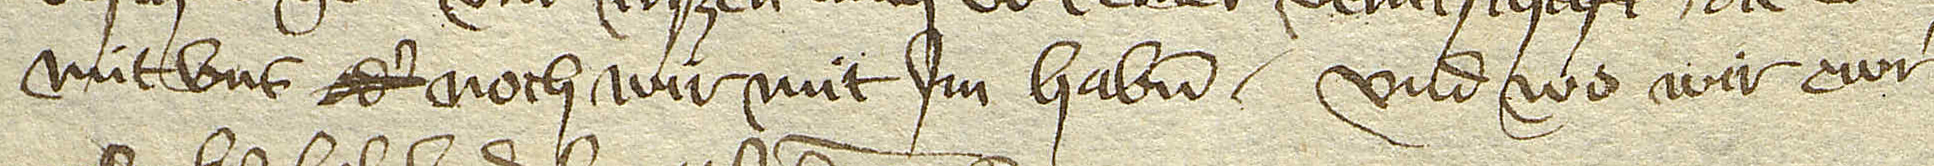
mit vns od* noch wir mit Im habn* / vnd wo wir ewr*
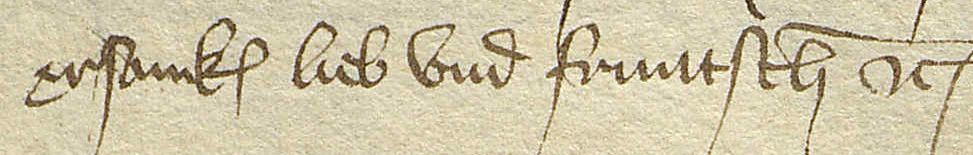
erſamk* lieb vnd fruntſch* ec*
